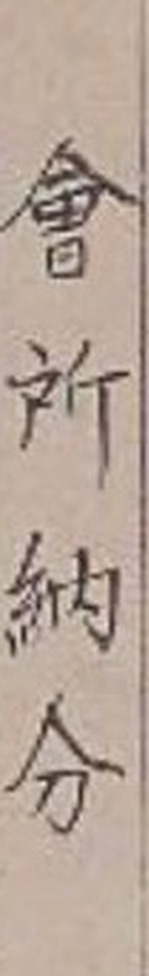㑹所納分
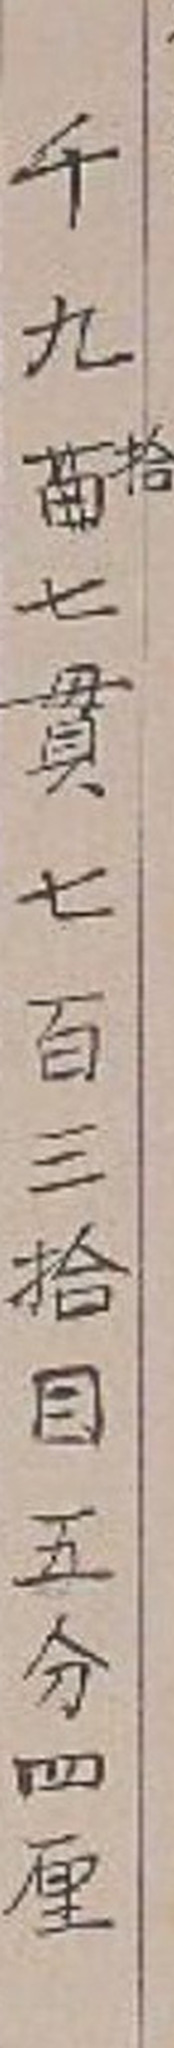千九百七貫百拾目五分四厘
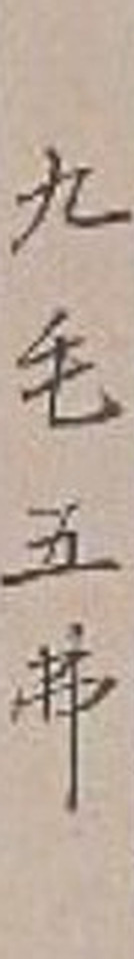九毛五弗
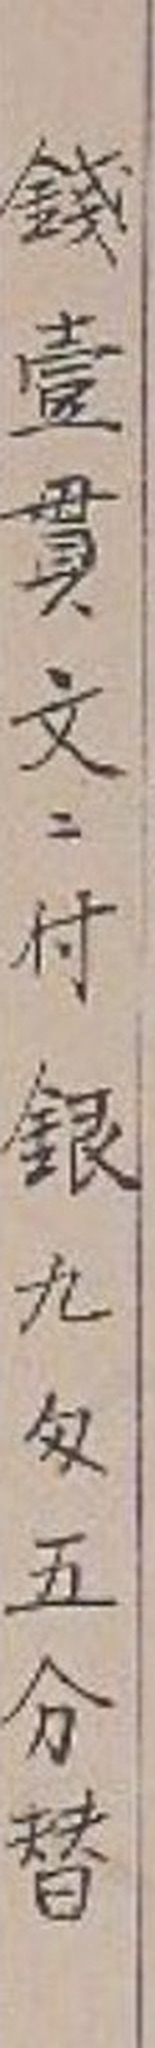錢壹貫文ニ付銀九匁五分替
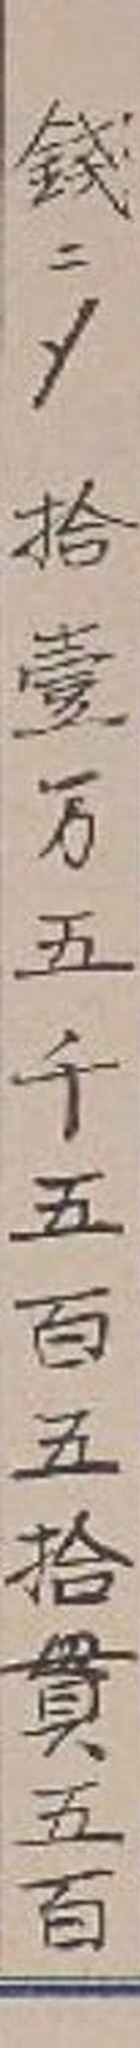錢ニシテ拾壹万五千五百五拾貫五百
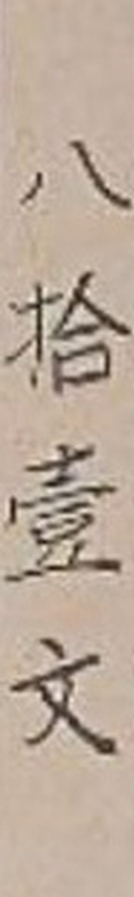八拾壹文
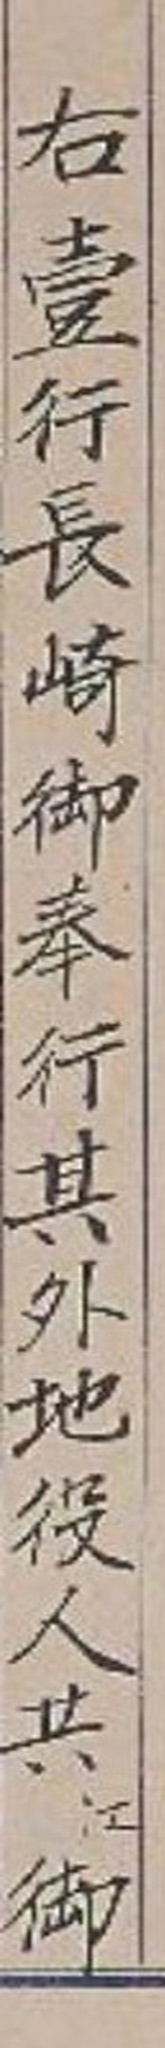右壹行長崎御奉行其外地役人共江御
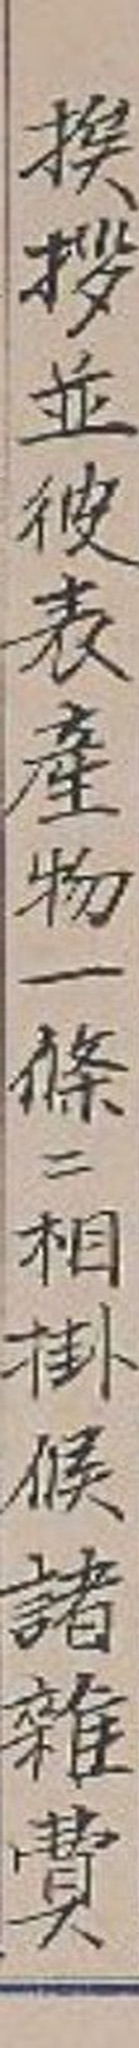挨拶並彼表産物一條ニ相掛候諸雜費
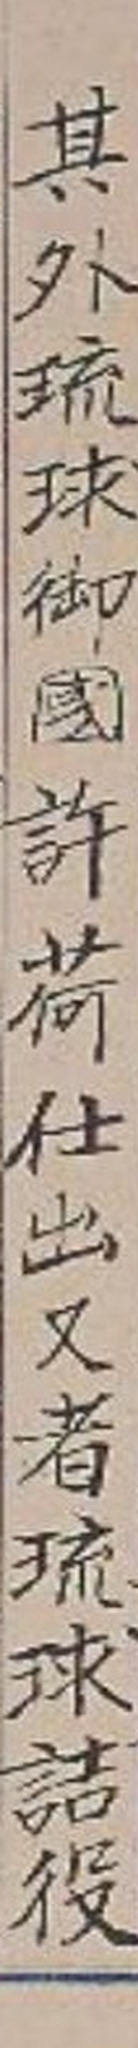其外琉球御國許荷仕出又者琉球詰役
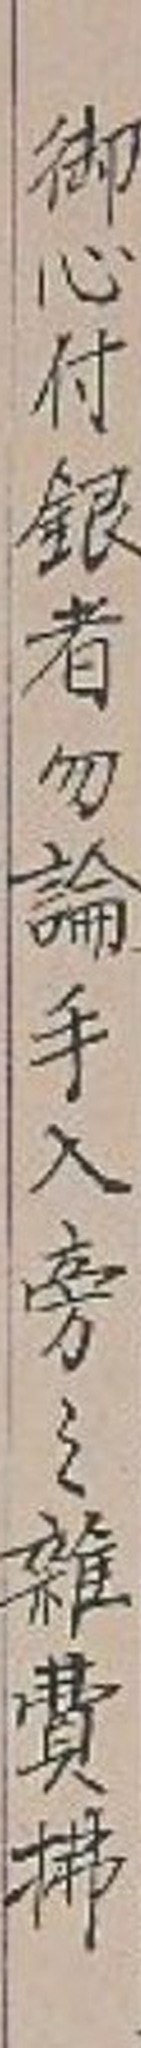御心付銀者勿論手入旁〻雜費拂
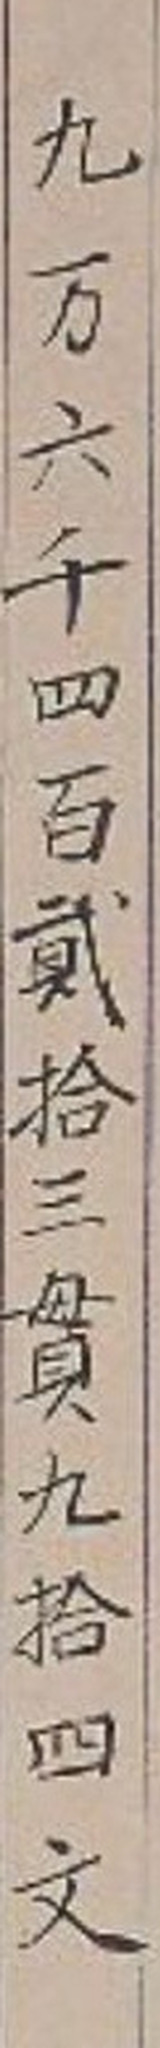九万六千四百貮拾三貫九拾四文
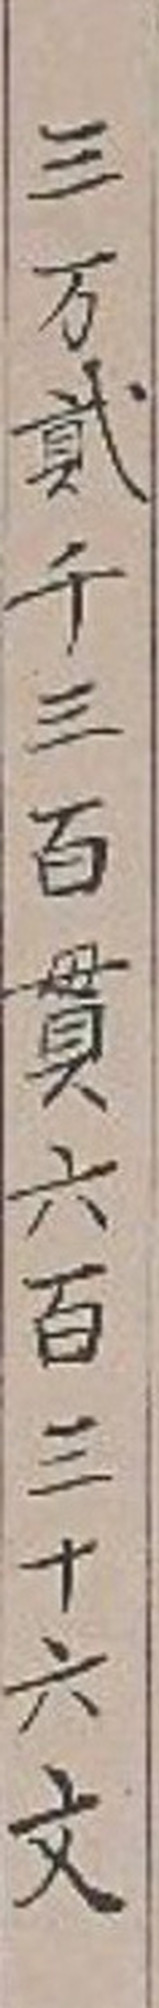三万貮千三貫六百三十六文
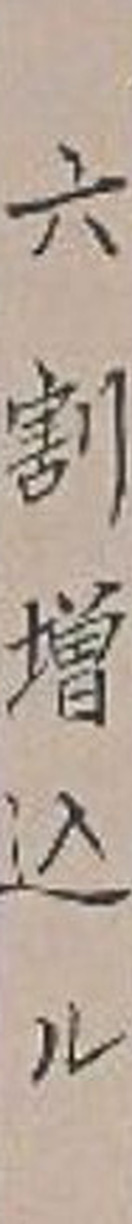六割増込ル
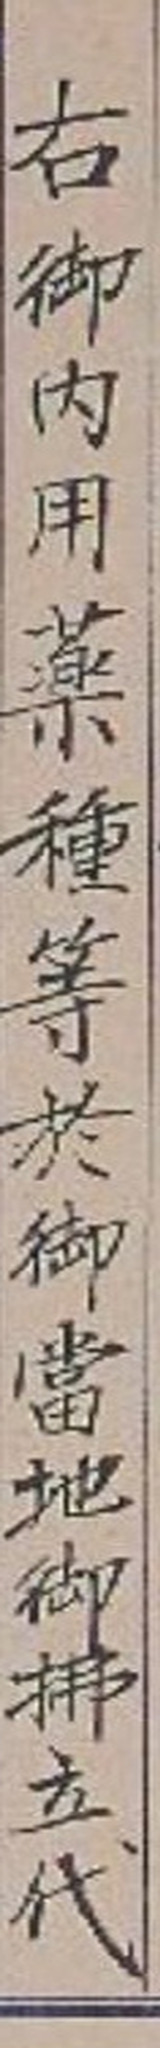右御内用品薬種等於御當地御拂立代

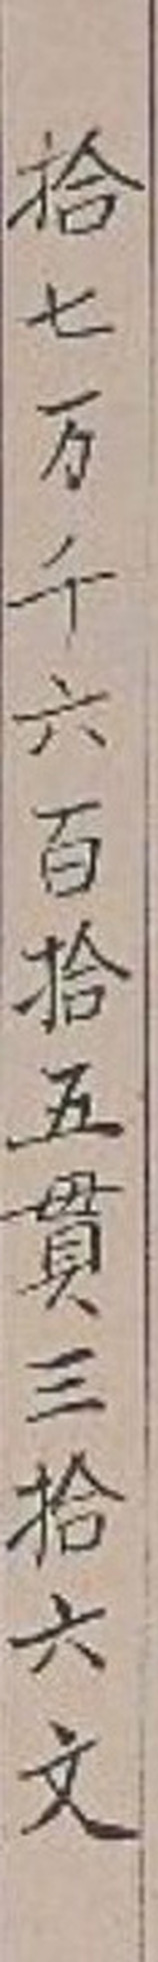拾七万千六百拾五貫三拾六文
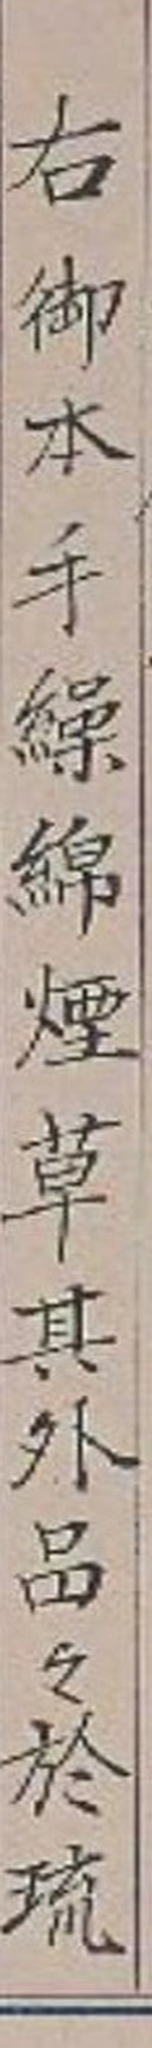右御本手繰綿煙草其外品々於琉
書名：琉球産物於長崎拂立並本手品利潤総帖 弘化四年より酉年迄
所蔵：University of the Ryukyus Library
